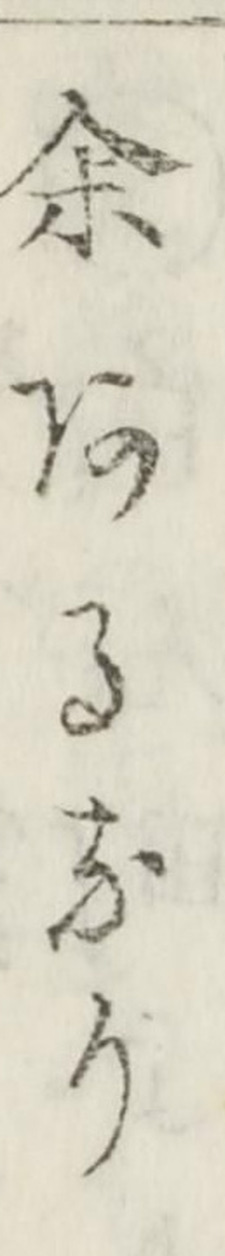余あるなり
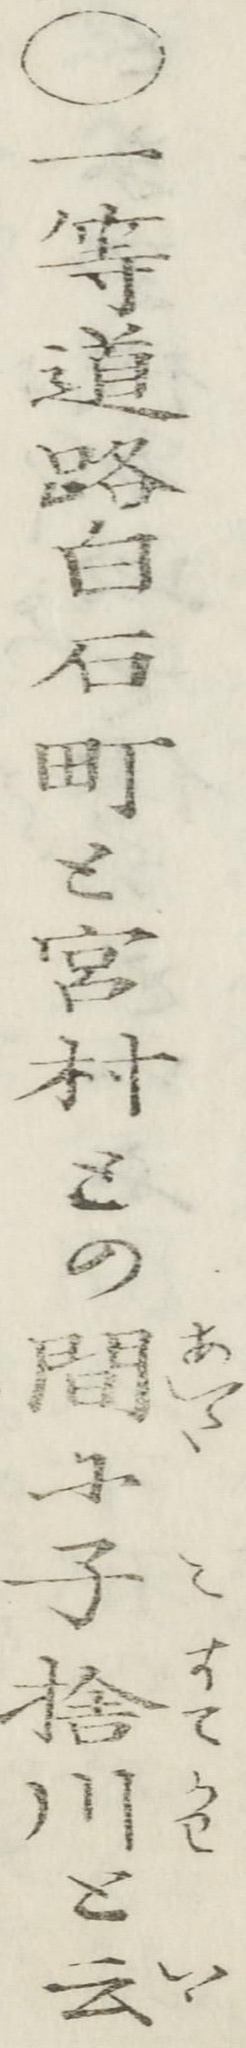〇一等道路白石町と宮村との間に子捨川と云
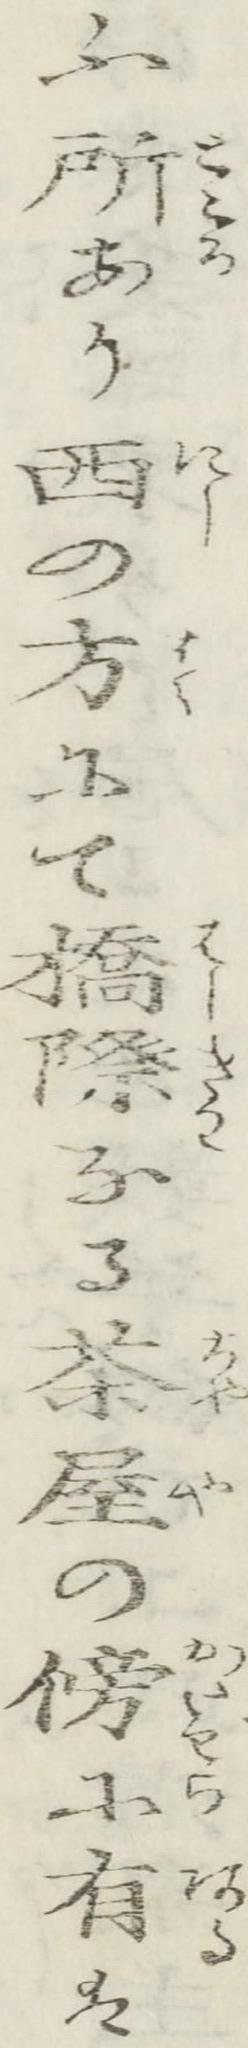ふ所あり西の方にて橋際なる茶屋の傍に有は
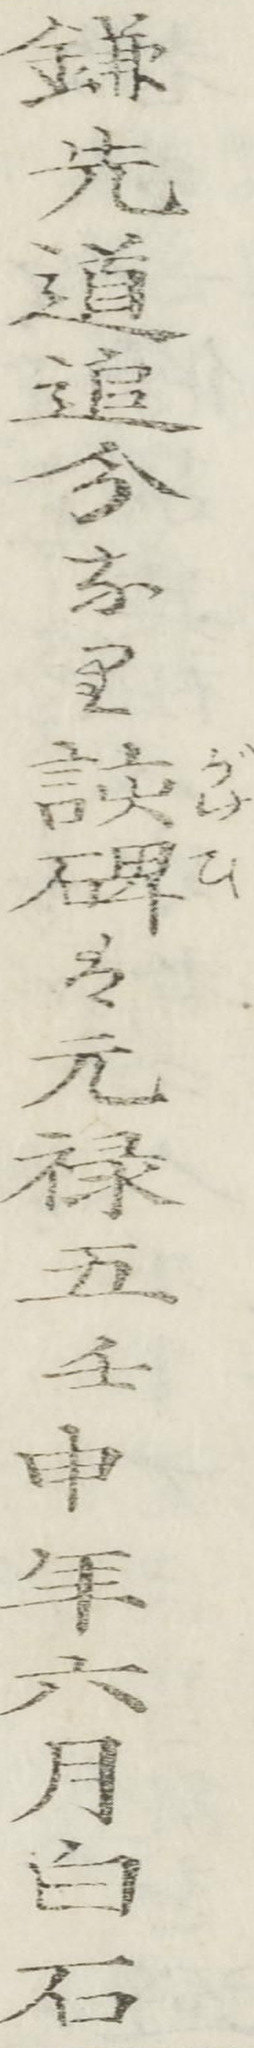鎌先道追分なり該碑は元禄五壬申年六月白石
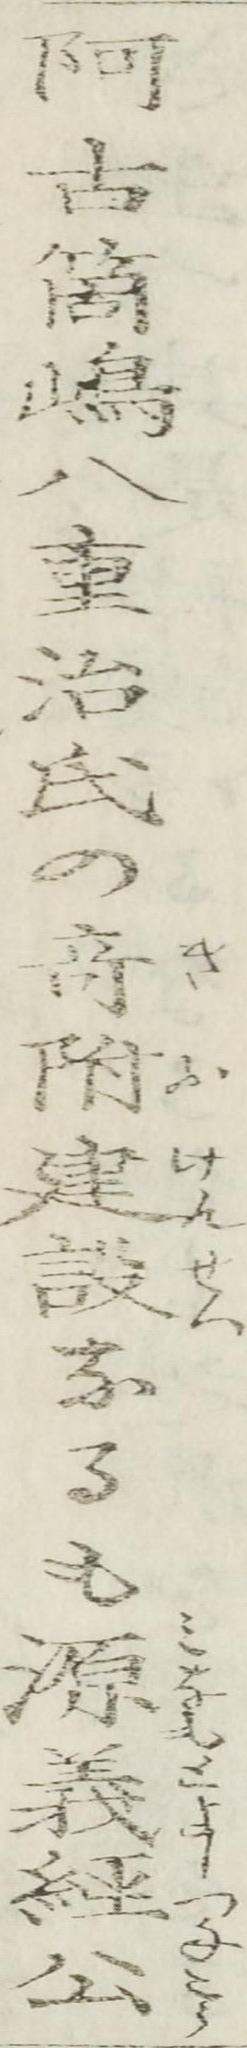阿古箇嶋八重治氏の奇附建設なるも源義経公
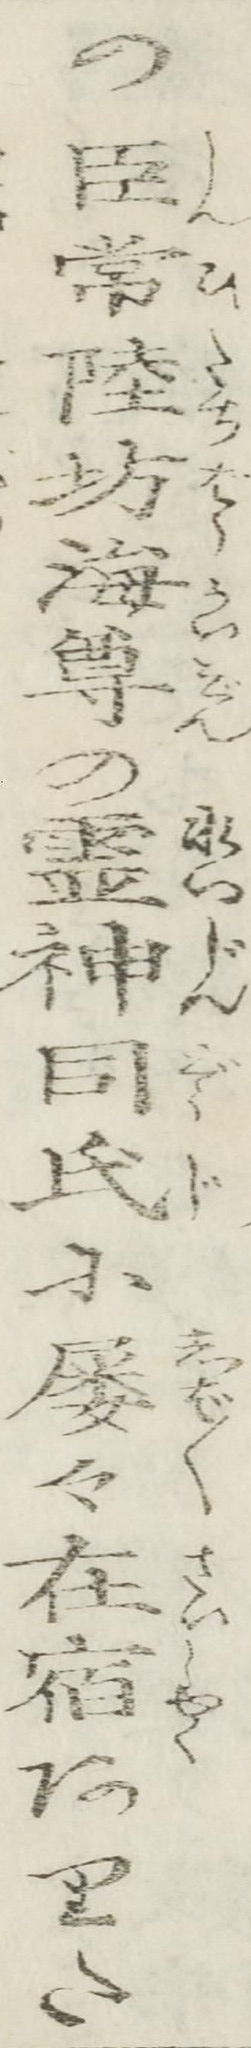の臣常陸坊海尊の霊神同氏に屡々在宿あるた
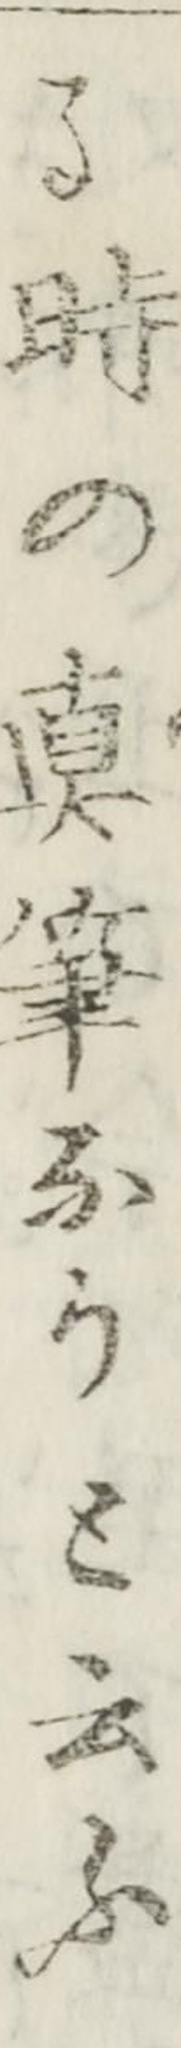る時の真筆なりと云ふ
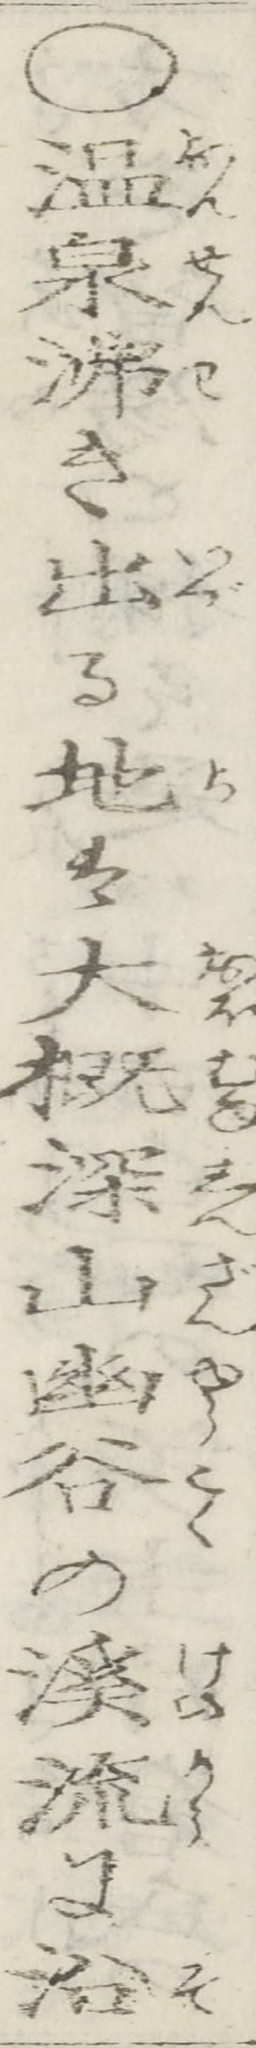〇温泉沸き出る地は大概深山幽谷の渓流に沿
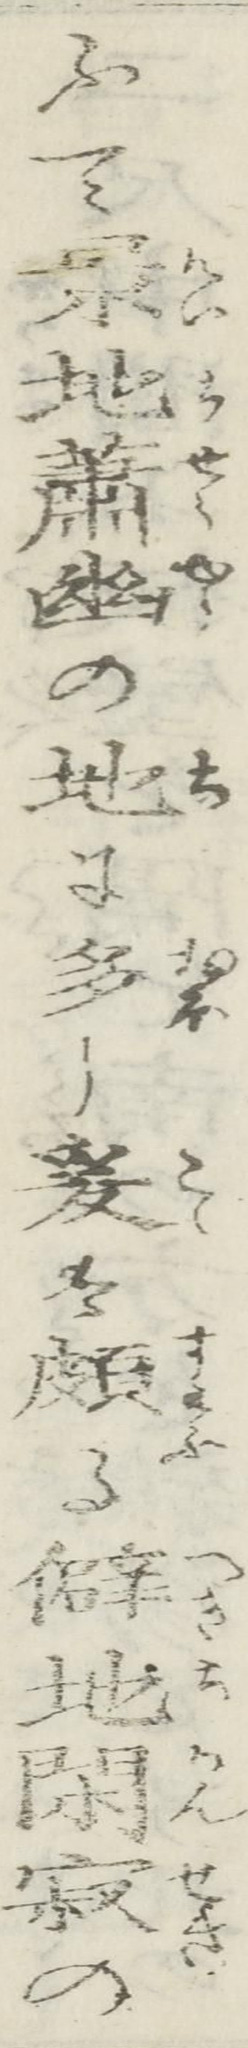ふて景地蕭幽の地に多し爰を頗る僻地閑寂の
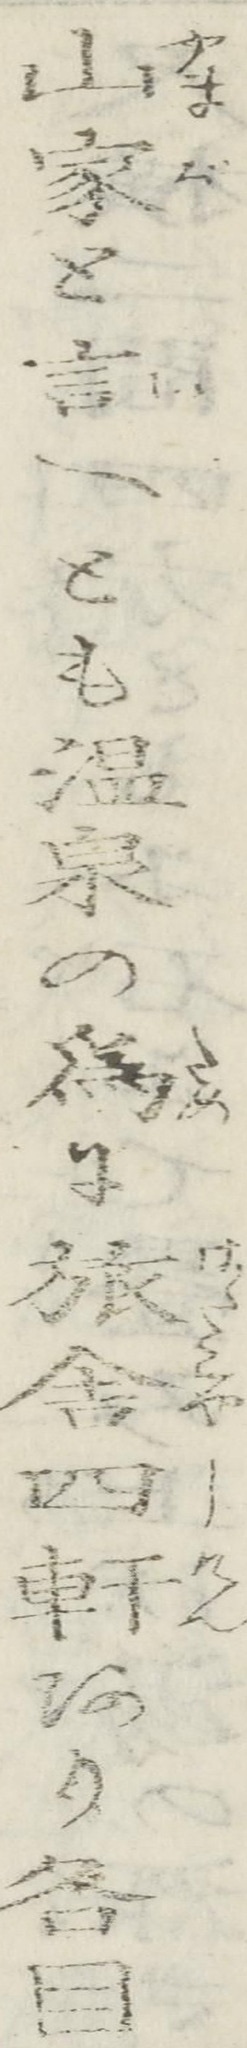山家と言へとも温泉の為に旅舎四軒あり各目
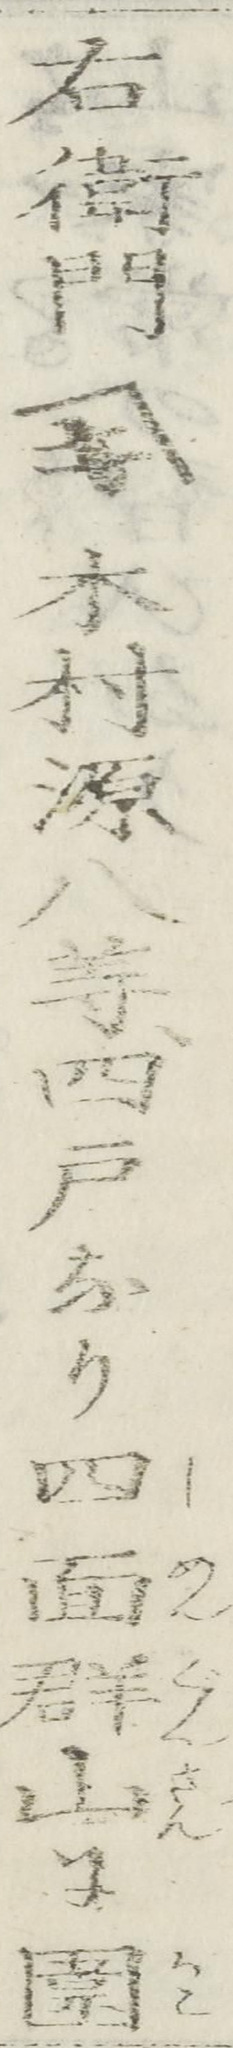右衛門木村源八等、四戸なり四面群山に囲
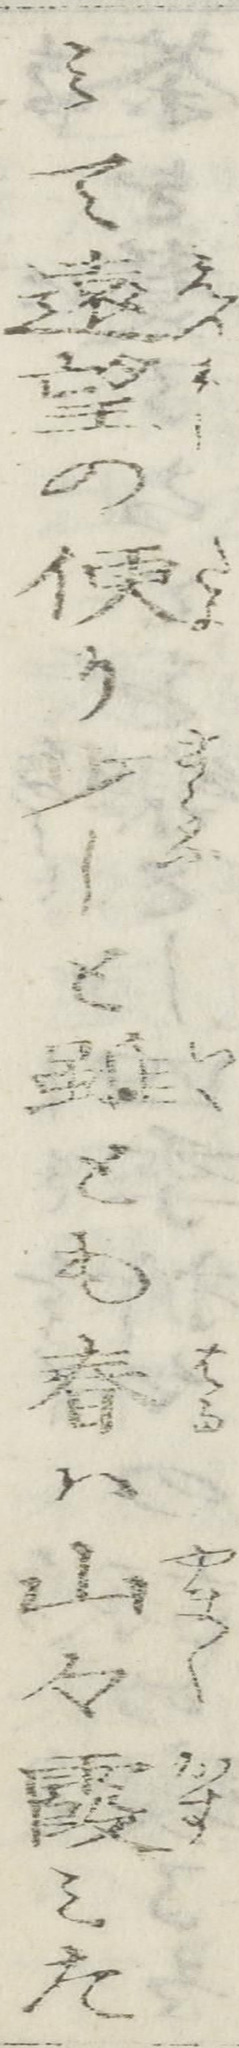みて遠望の便り少しと雖とも春は山々霞みた
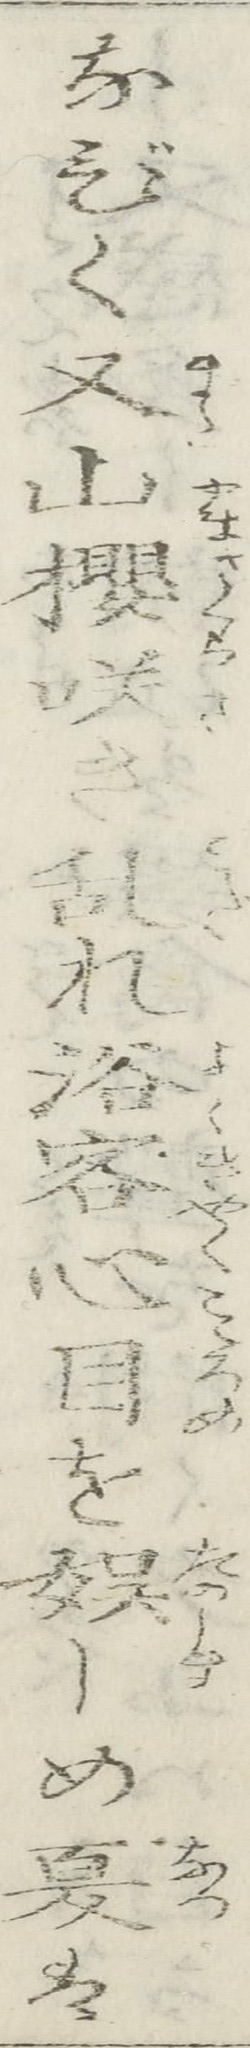なびく又山桜咲き乱れ浴客心目を娯しめ夏は
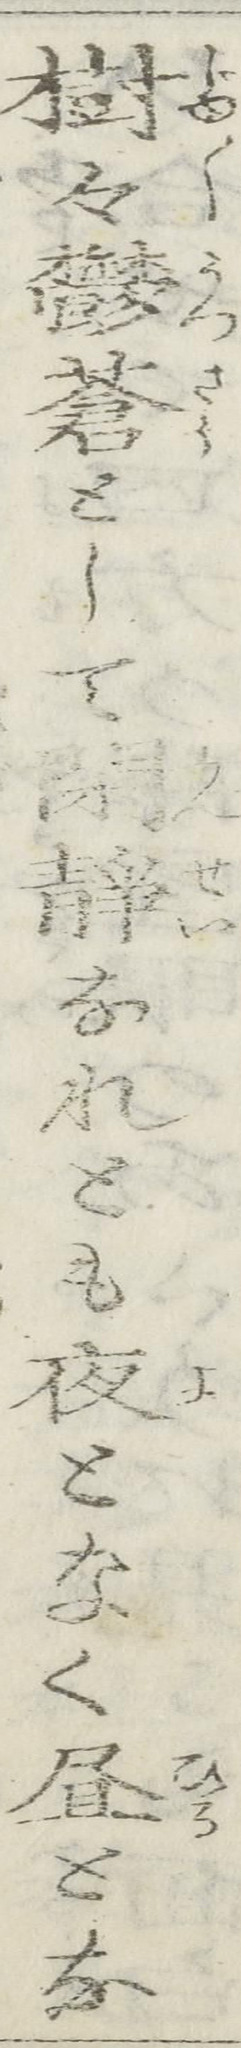樹々鬱蒼として閑静なれとも夜となく昼とな
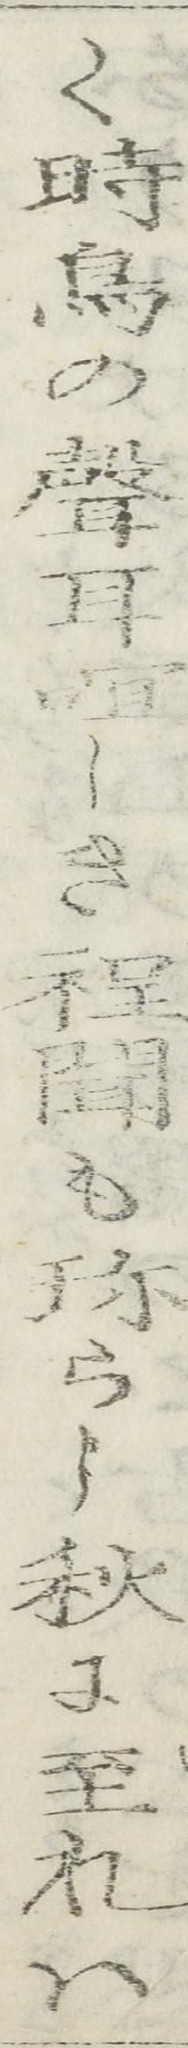く時鳥の声耳喧しき程聞も珍らし秋に至れは
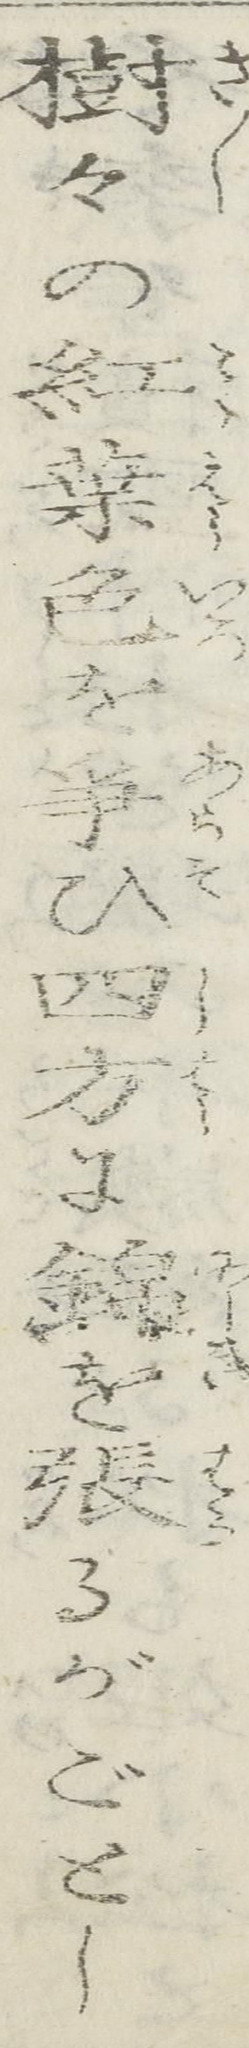樹々の紅葉色を争ひ四方に錦を張るがごとし
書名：鎌先温泉由來記
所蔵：東京大学地震研究所図書室 Earthquake Research Institute Library, The University of Tokyo, JAPAN
